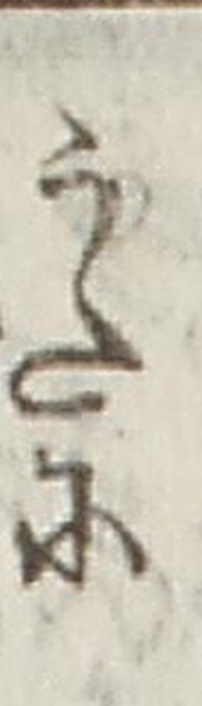うたに
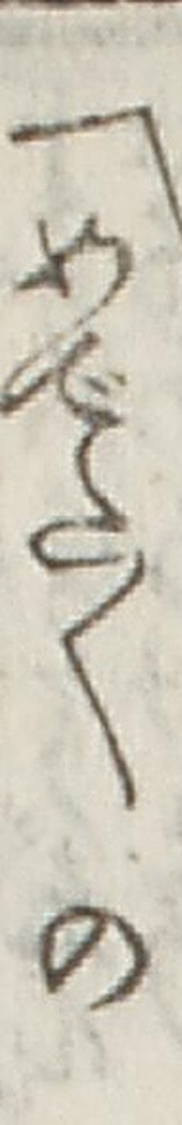〽めでた〳〵の
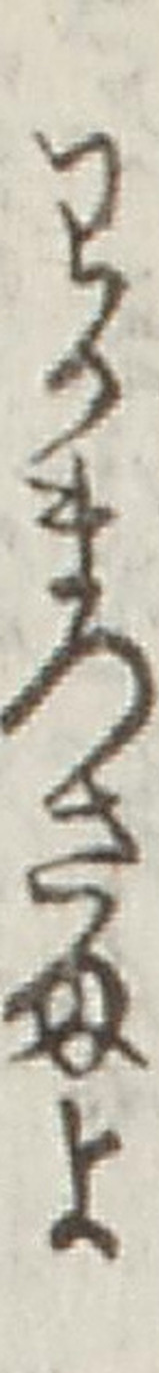わかまつさまよ
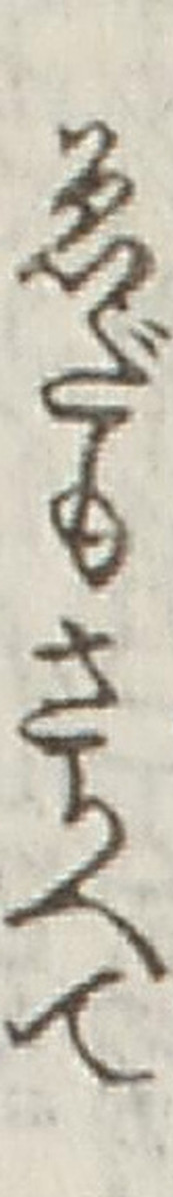ゑだもさかへて
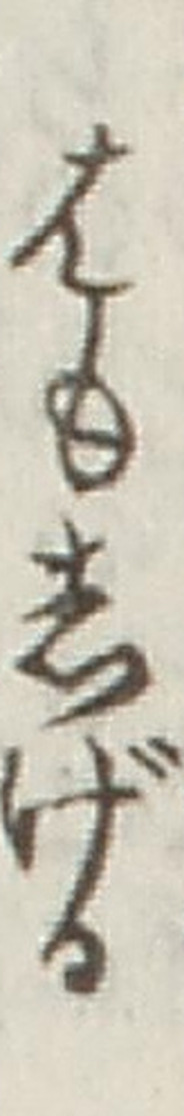はもしげる
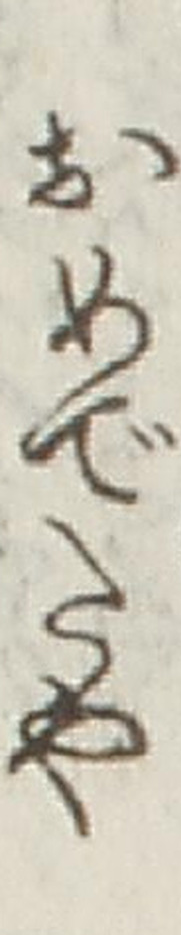おめでたや

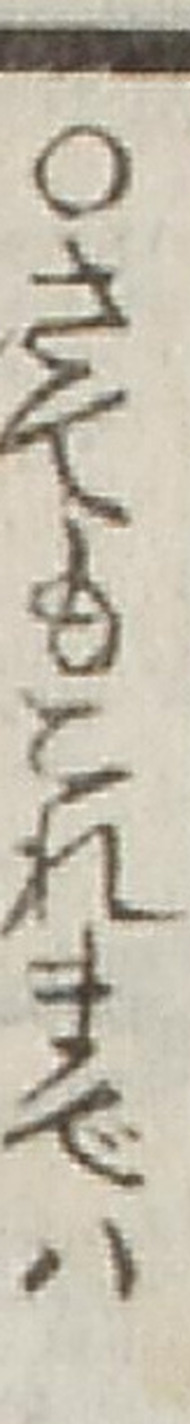○さてもこれまでは
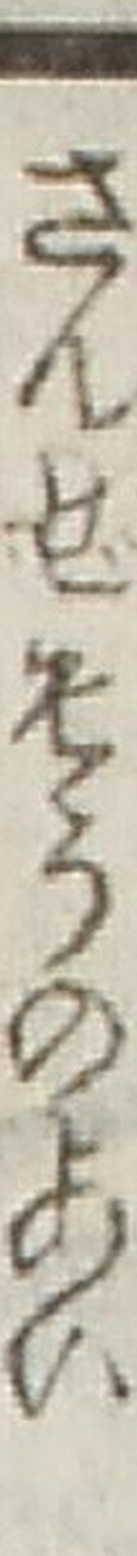さんぜそうのあい
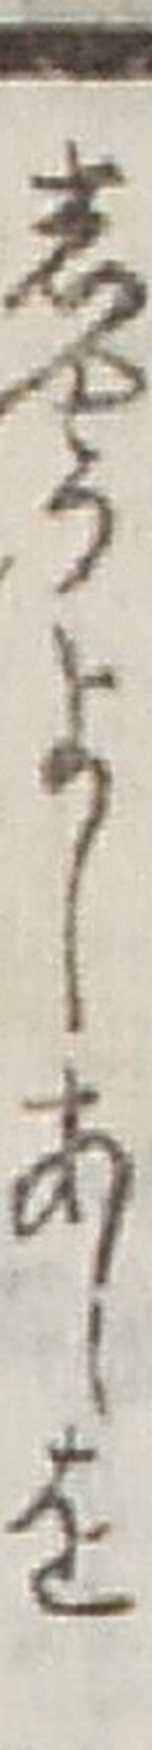しやうよしあしを
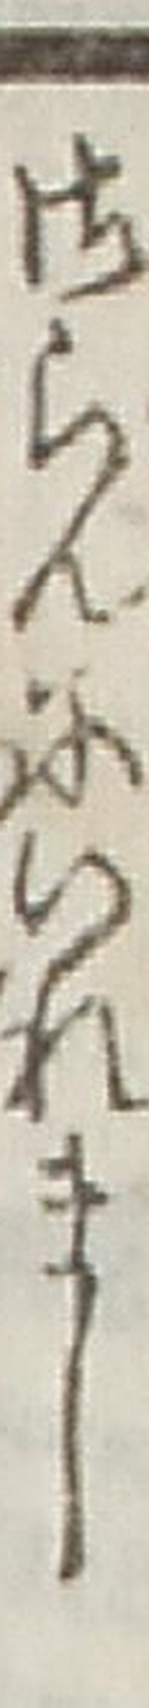御らんにいれまし
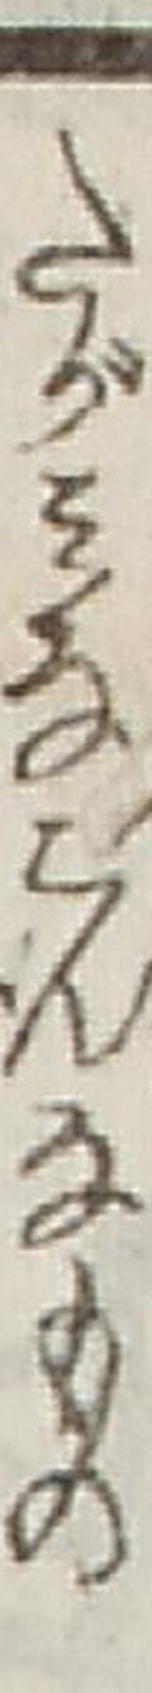たがみなこんなもの
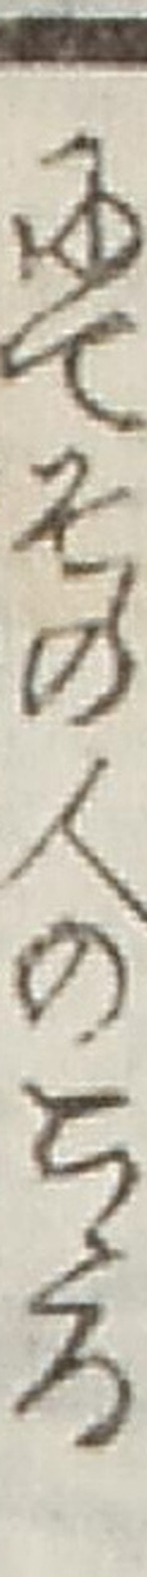にてその人のこゝろ
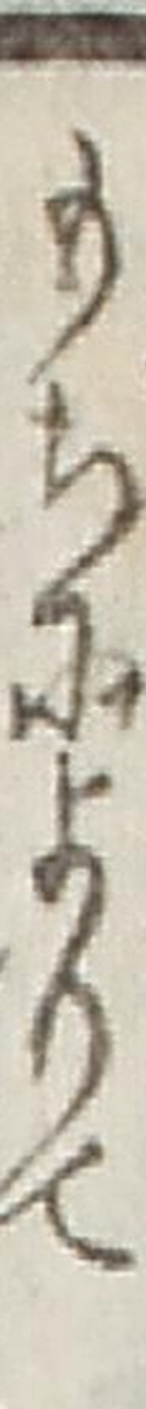もちによりて
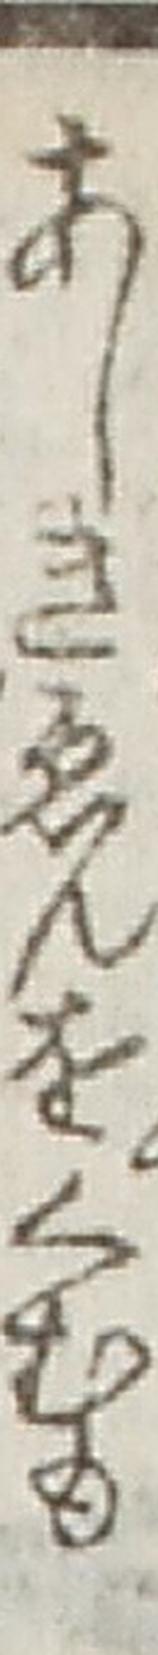あしきえんをくむも
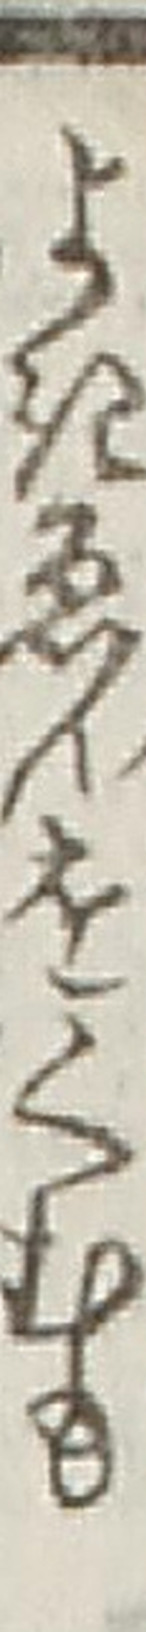よきえんをくむも
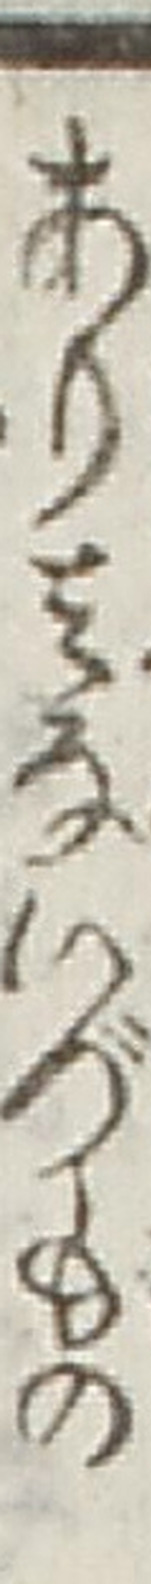ありみないづもの
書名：三世相出雲當座帳　上下冊
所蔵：東京大学地震研究所図書室 Earthquake Research Institute Library, The University of Tokyo, JAPAN
